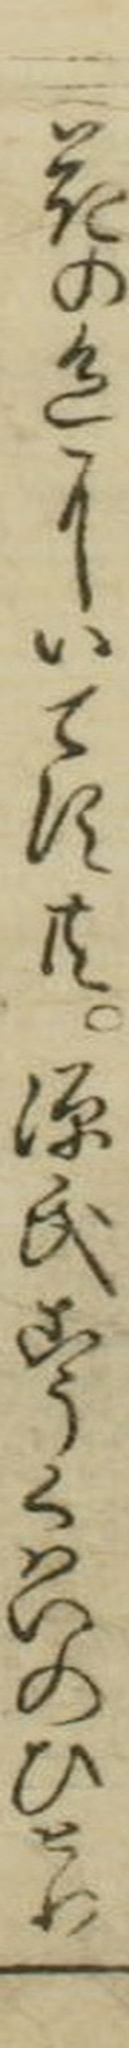花の色にいてす共。源氏こうくハいのひとり
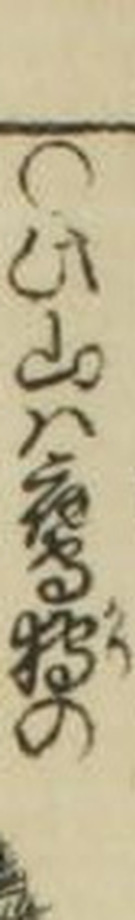◯此山ハ鷹狩の
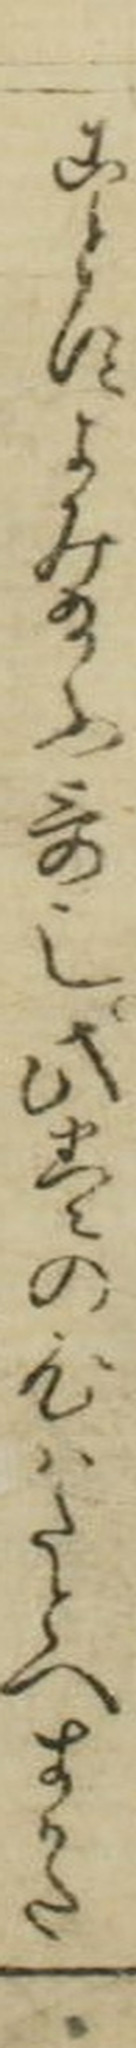ことすよみ給ふ歌也。此巻の心ハたとへすかた
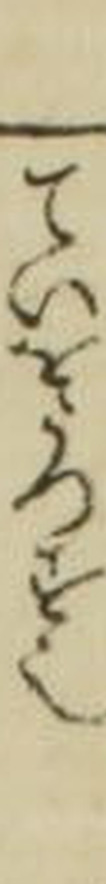ていをうつす也
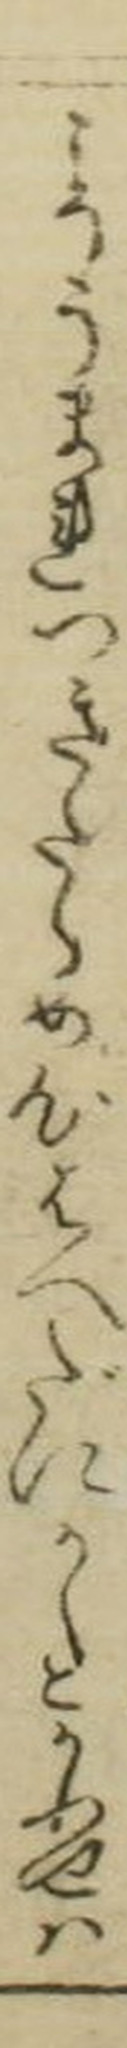こそうまれつきたらめ心はへだにかくとかふセハ
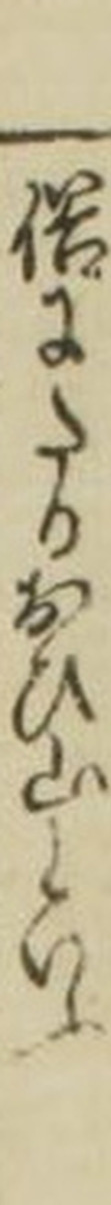俗にたるおひ山といふ
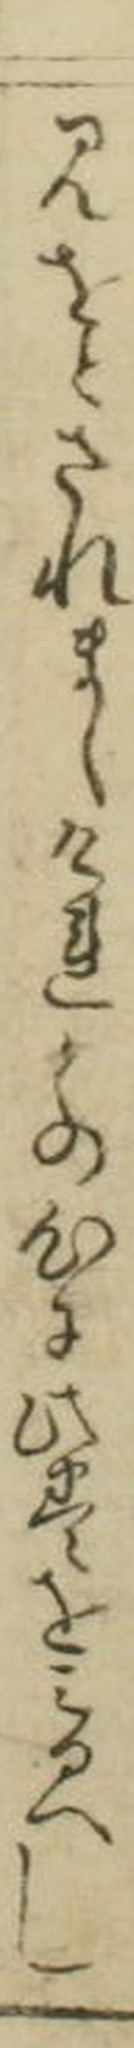見をとされましけれとの心に此巻をミるへし
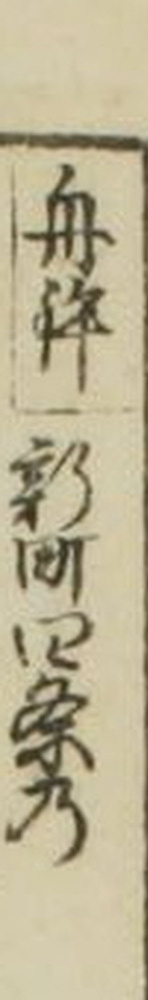舟鉾新町四条の
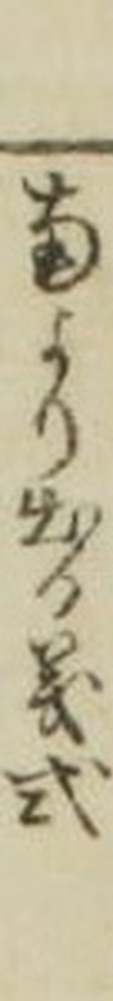南より出る義式
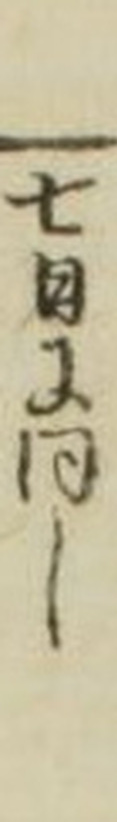七日に同し
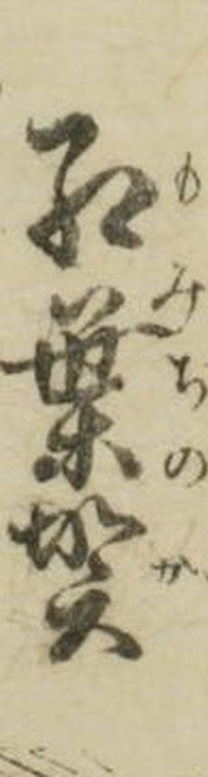紅葉賀
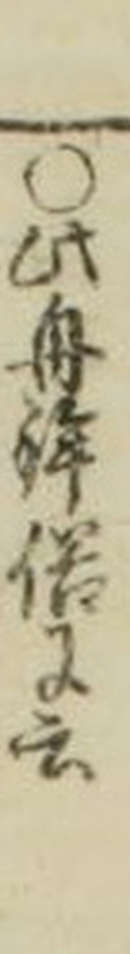◯此舟鉾俗に云
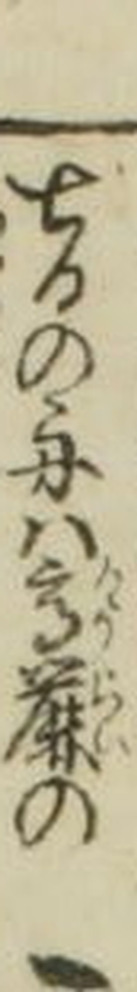七日の舟ハ高麗の
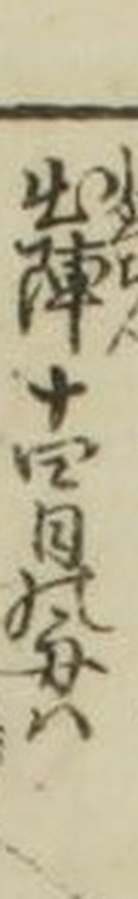出陣十四日の舟ハ
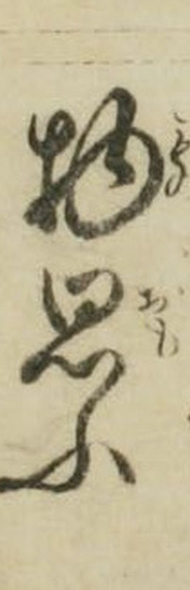物思ふ
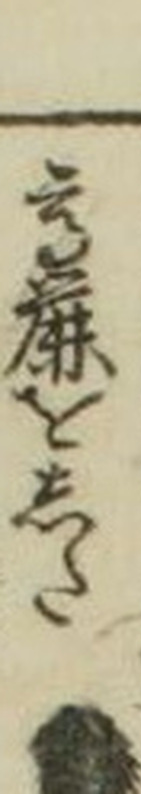高麗をした
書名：女源氏教訓鑑
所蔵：東京学芸大学附属図書館
